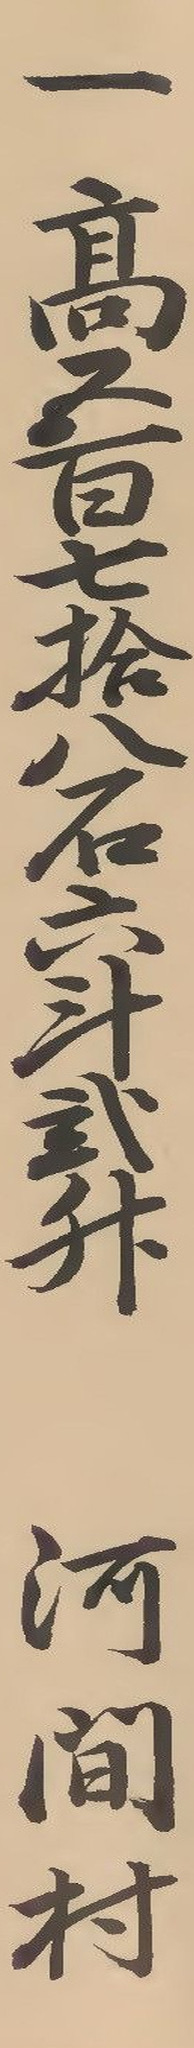一高五百七拾八石六斗弐升河間村
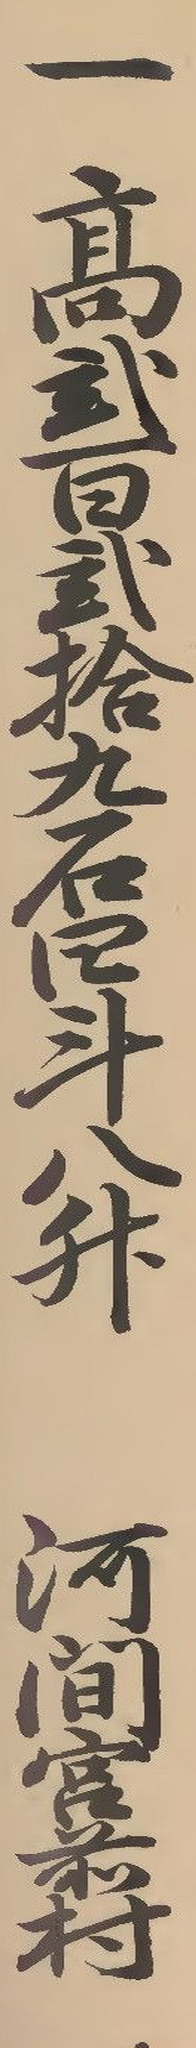一高弐百弐拾九石四斗八升河間宮前村
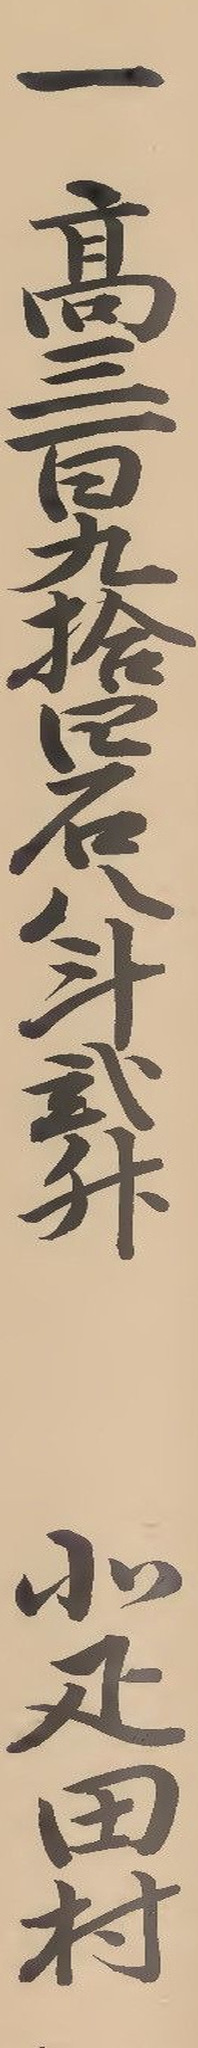一高三百九拾四石八斗弐升北疋田村
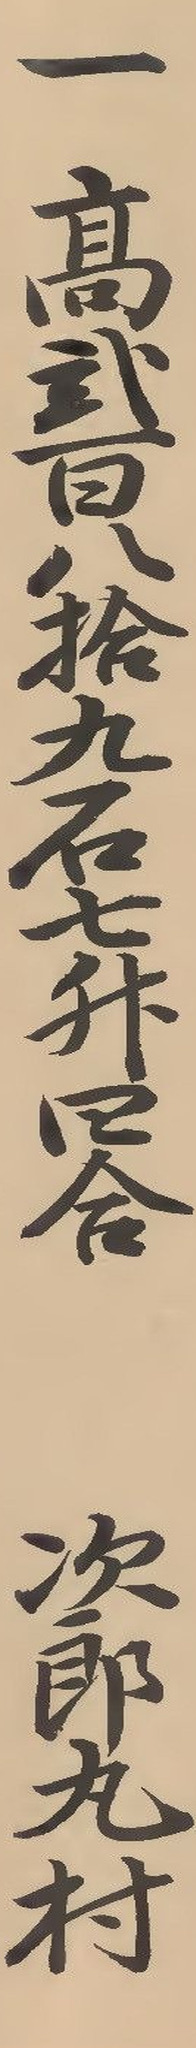一高弐百八拾九石七升四合次郎丸村
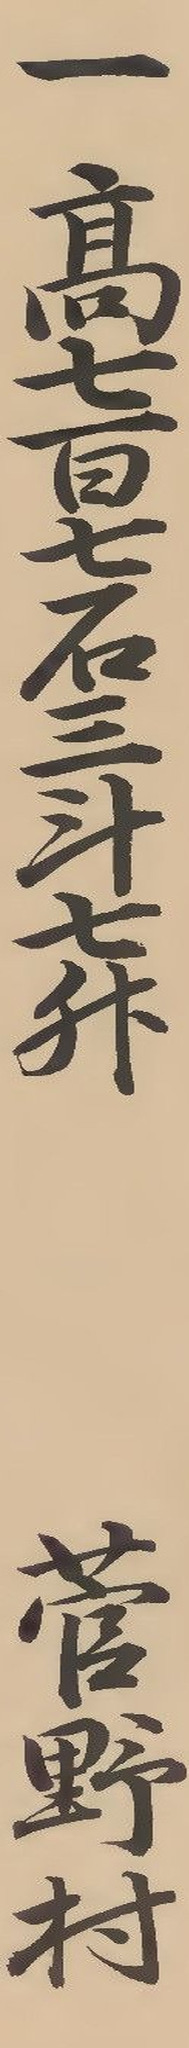一高七百七石三斗七升菅野村
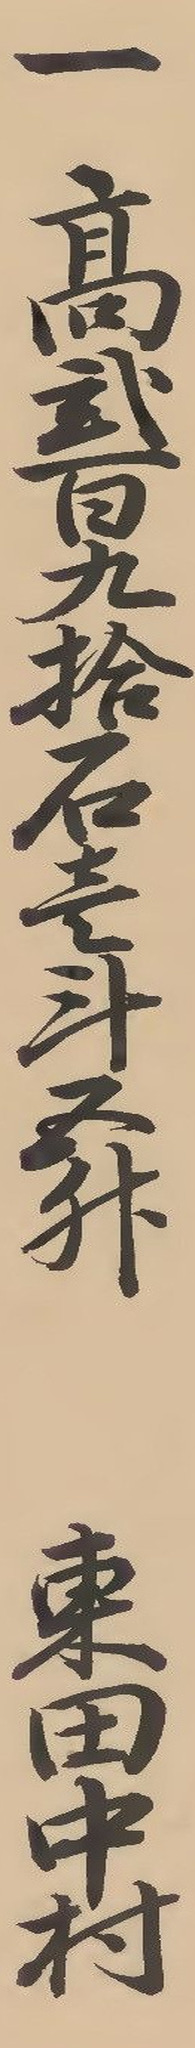一高弐百九拾石壱斗五升東田中村

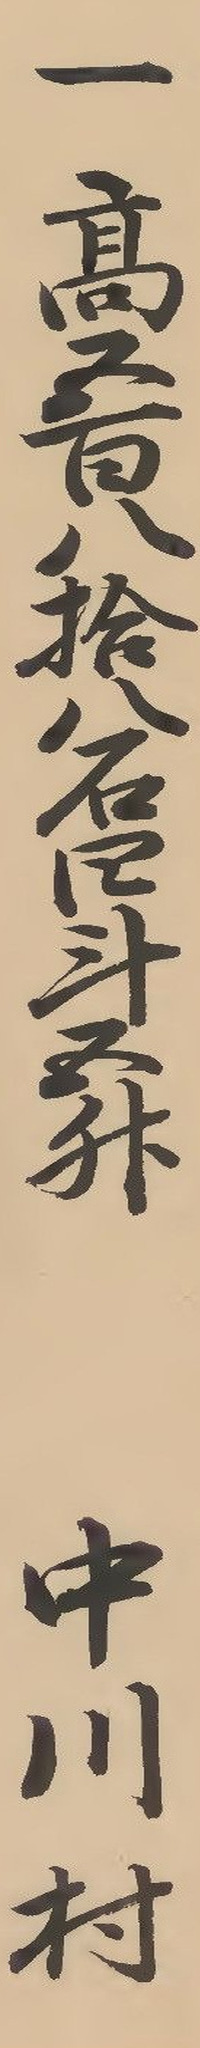一高五百八拾八石四斗五升中川村
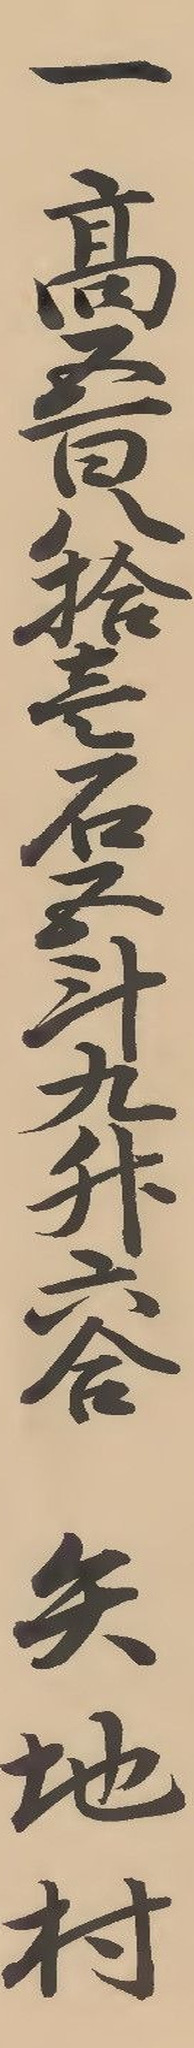一高五百八拾壱石五斗九升六合矢地村
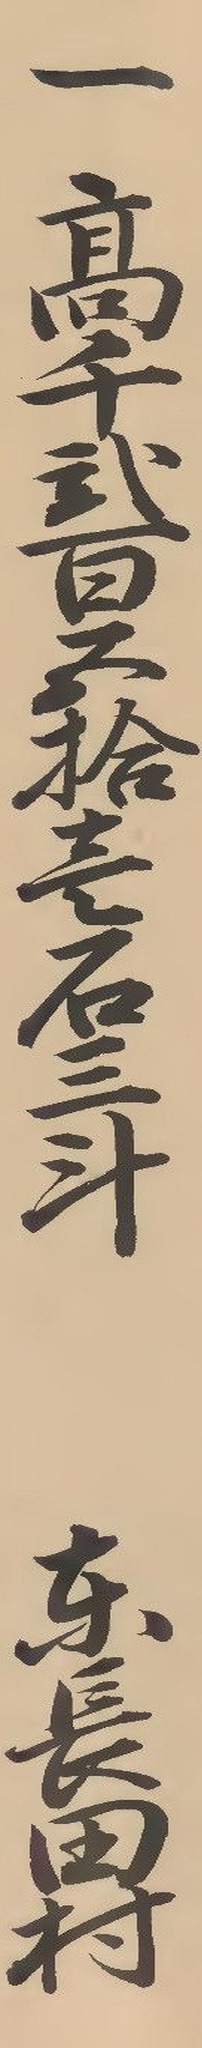一高千弐百五拾壱石三斗東長田村
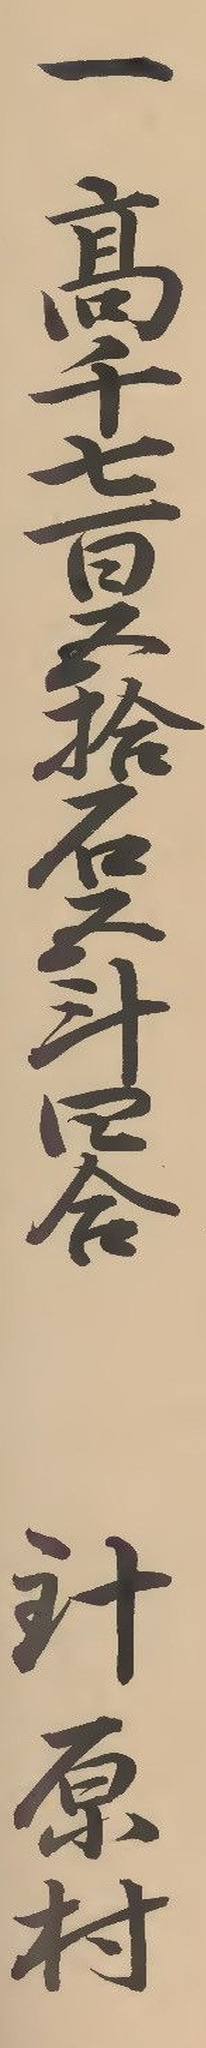一高千七百五拾石五斗四合針原村
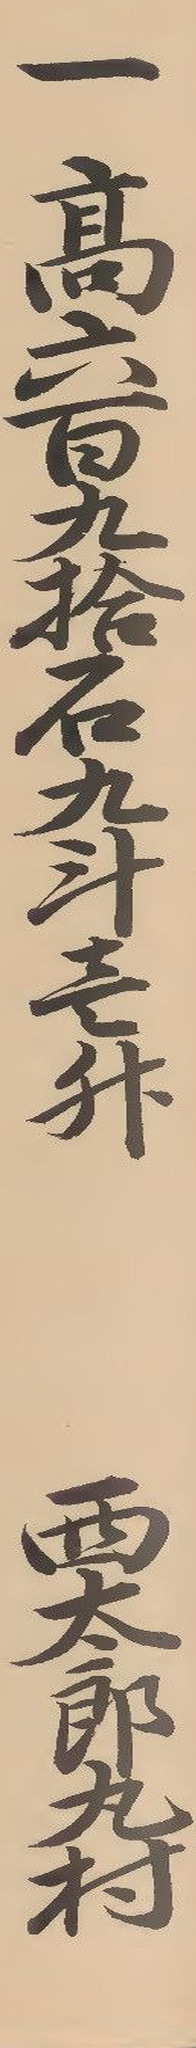一高六百九拾石九斗壱升西太郎丸村
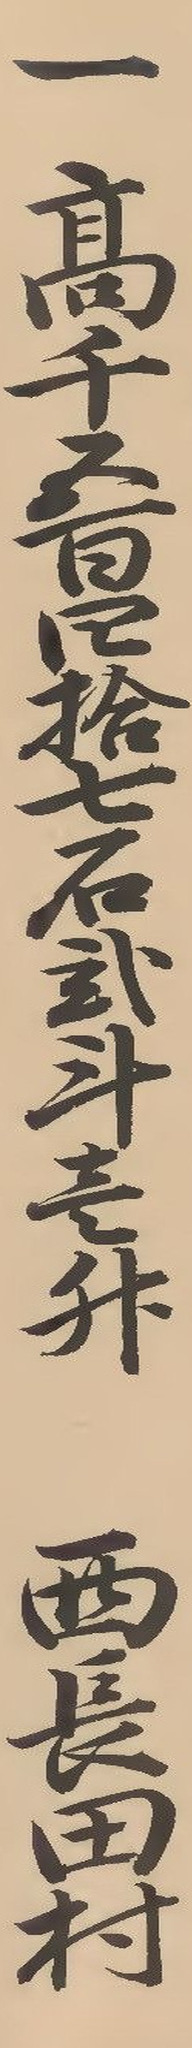一高千五百四拾七石弐斗壱升西長田村
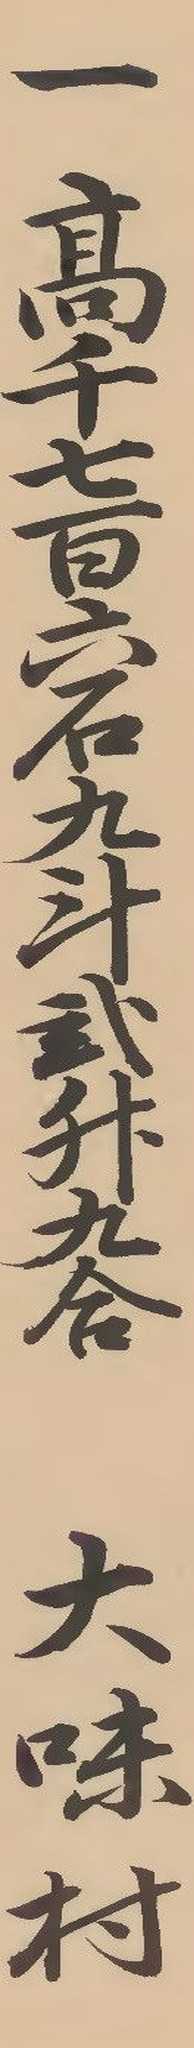一高千七百六石九斗弐升九合大味村

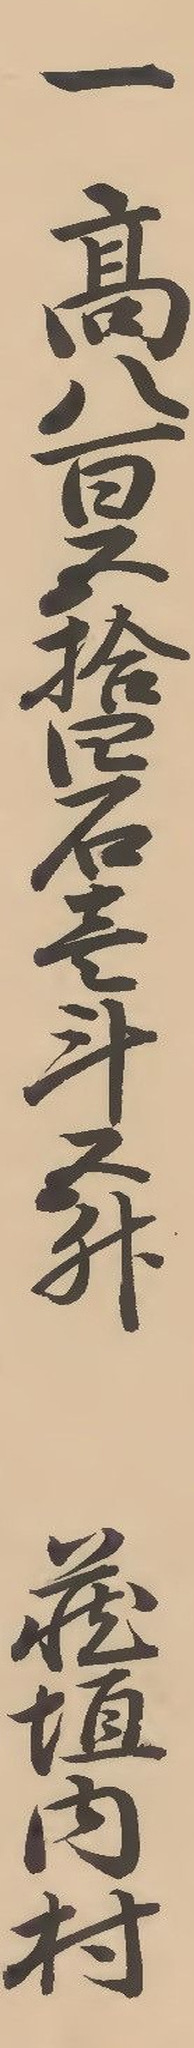一高八百五拾四石壱斗五升蔵垣内村
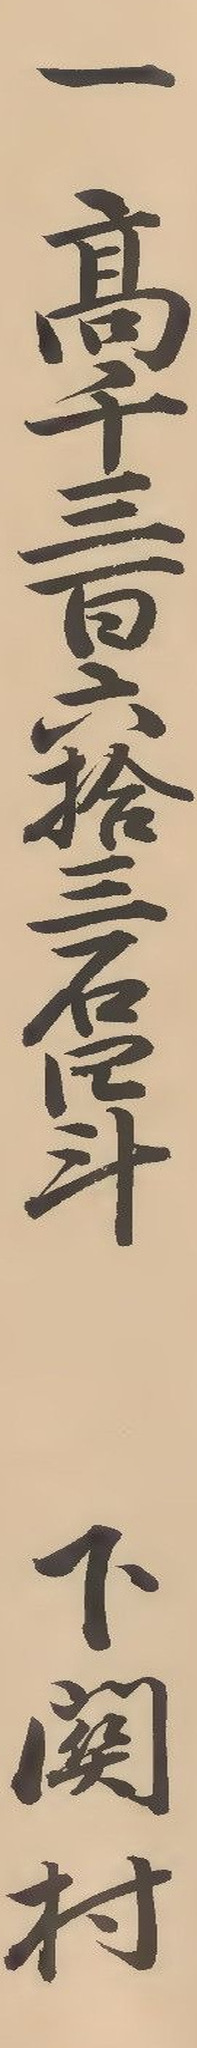一高千三百六拾三石四斗下関村
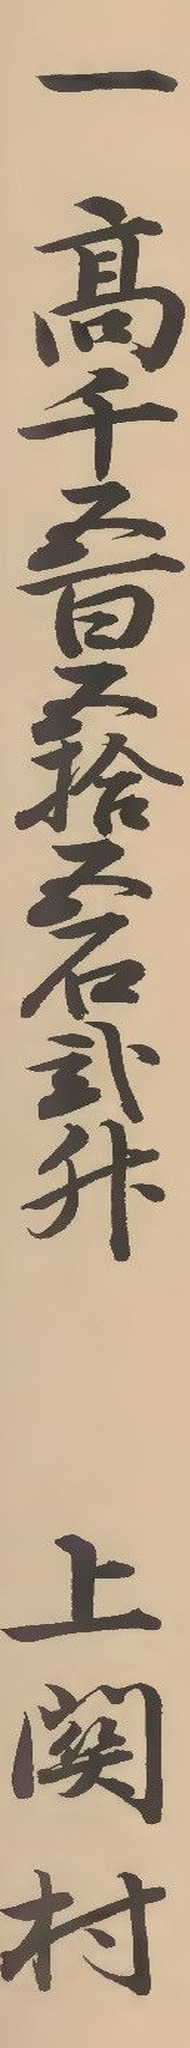一高千五百五拾五石弐升上関村
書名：越前国郷帳
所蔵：国立公文書館 National Archives of Japan
